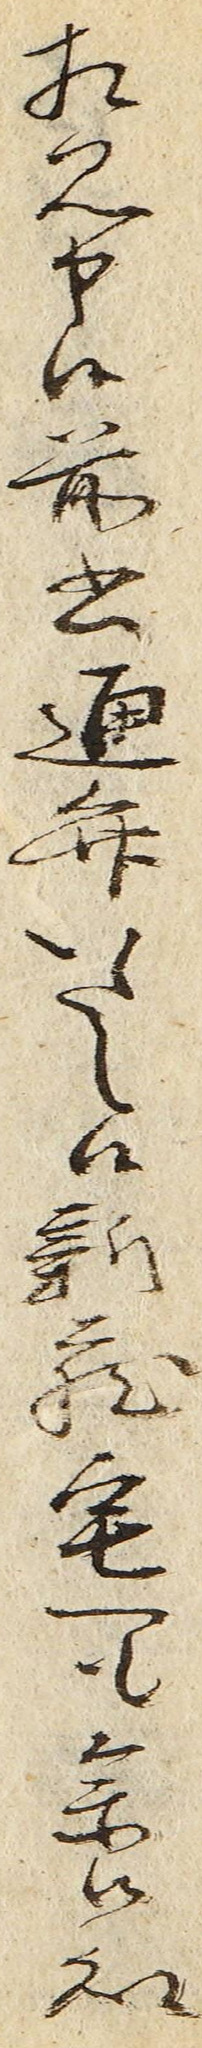相見申候前書通弁いたし候新蔵宅へも参候処
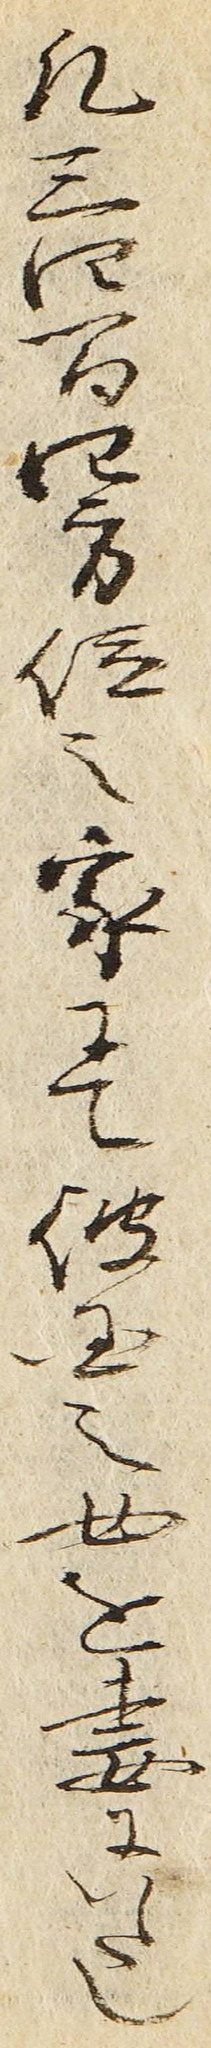凡三四間四方位之家にて彼国之女を妻にいたし
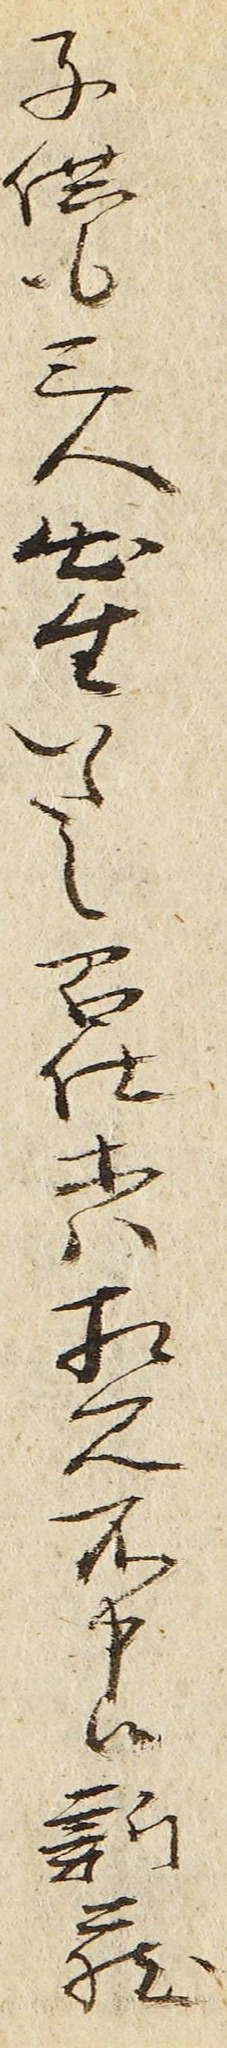子供も三人出生いたし召仕等は相見不申候新蔵
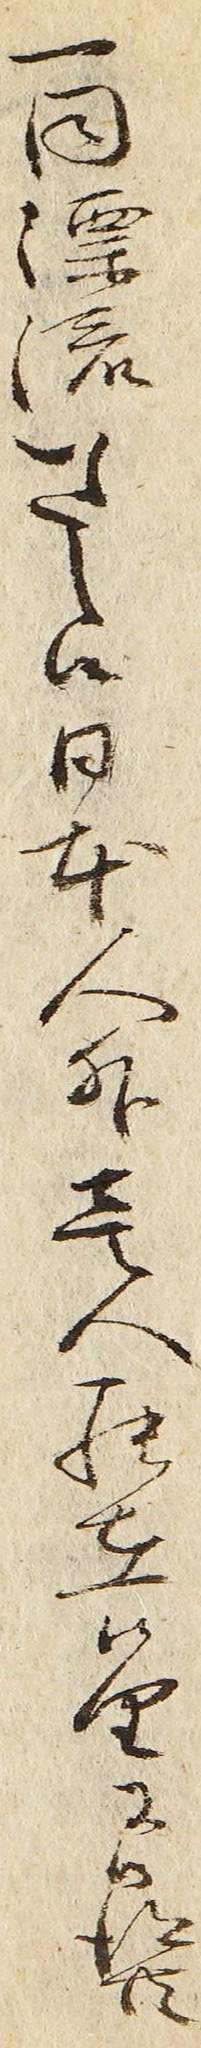一同漂流いたし候日本人外壱人罷在候由に候得共
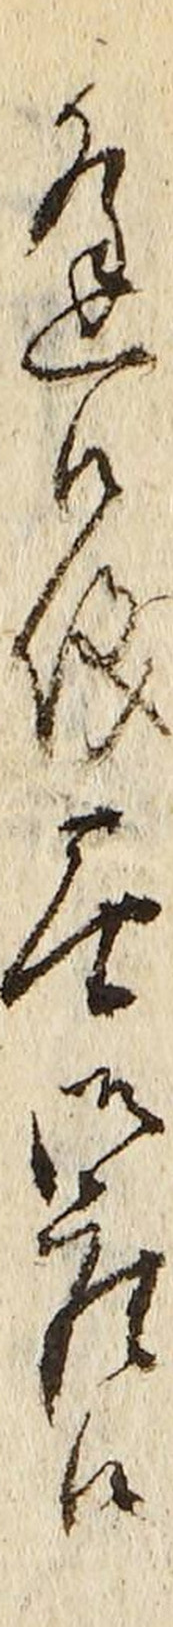逢候儀無御座候
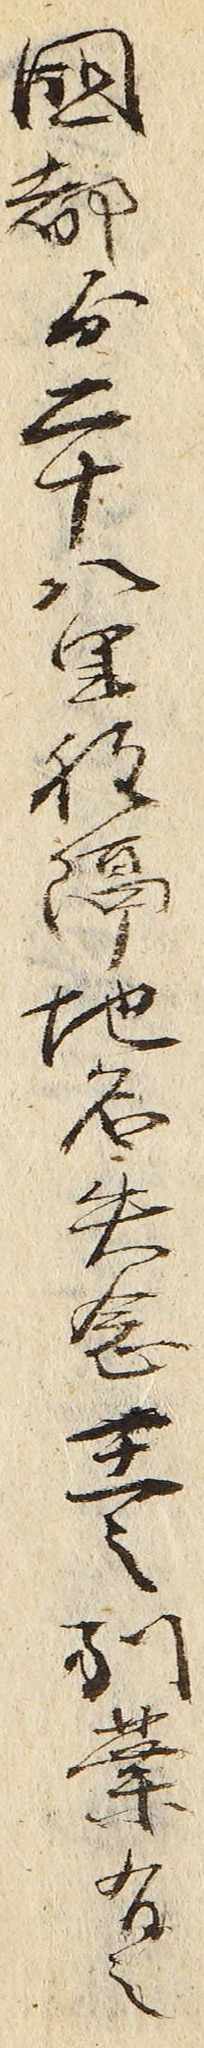国都ゟ二十八里程隔地名失念王之別業有之
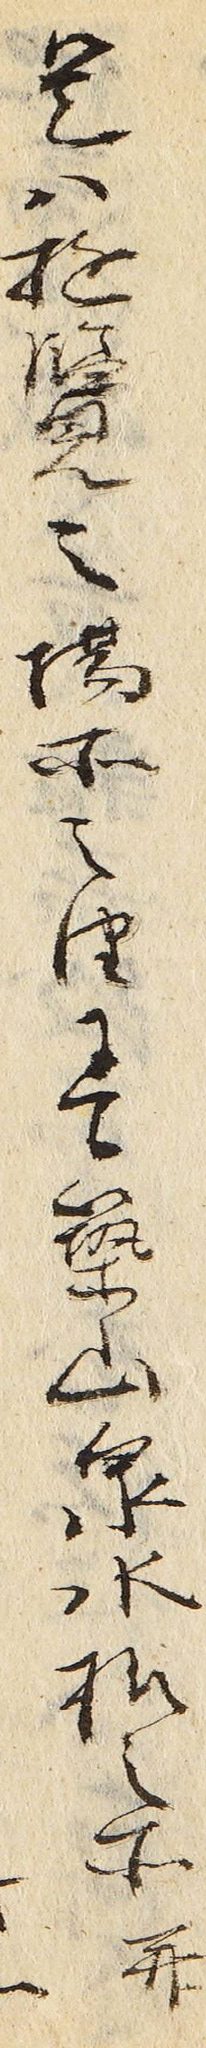是は遊覧之場所之由にて築山泉水様之所并
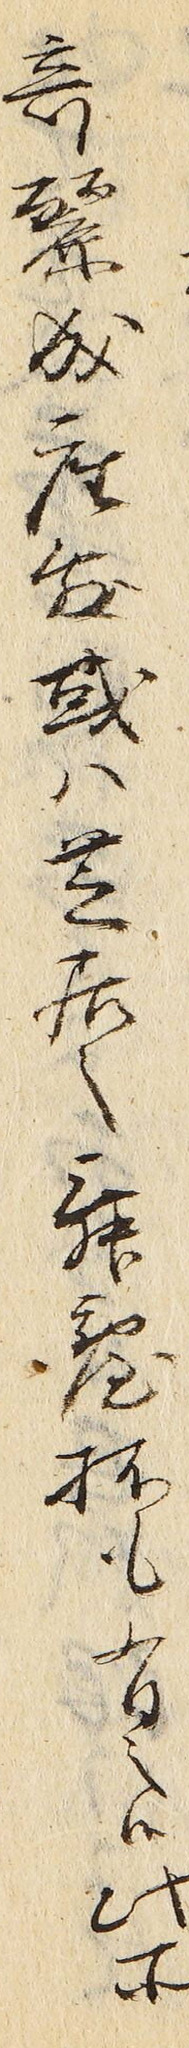奇麗成座敷或は芝居之舞台等も有之候此所
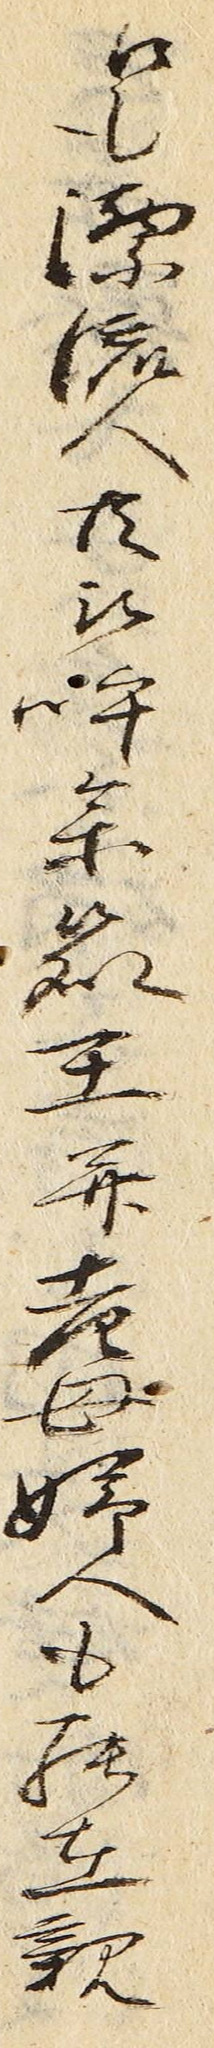えも漂流人共被呼参候処王并老母婦人も罷在親
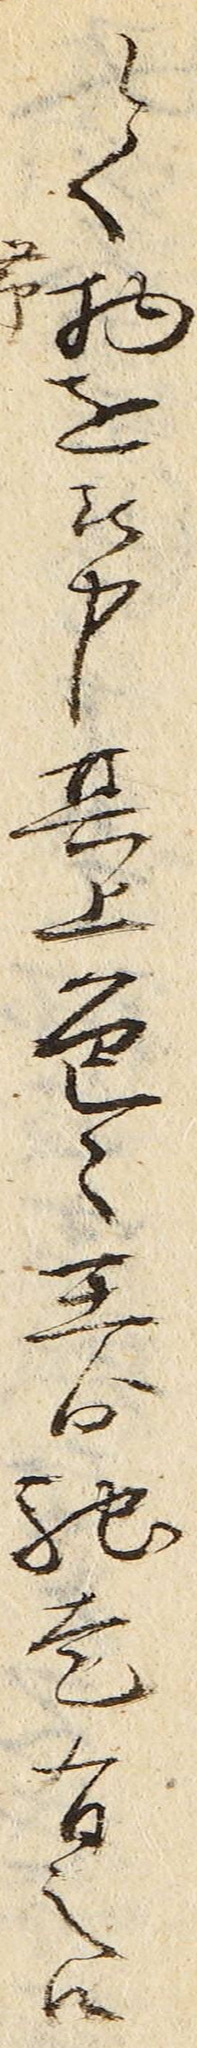しく物を被申其上色々王ゟ馳走有之候
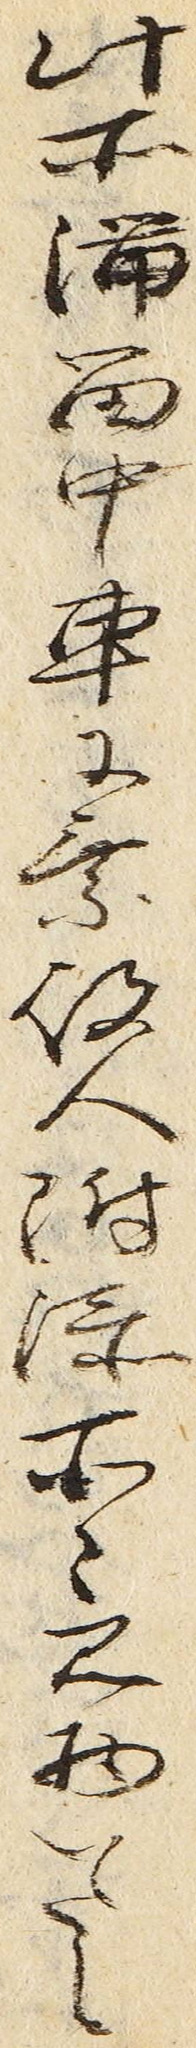此所滞留中車に乗役人附添所々見物いたし
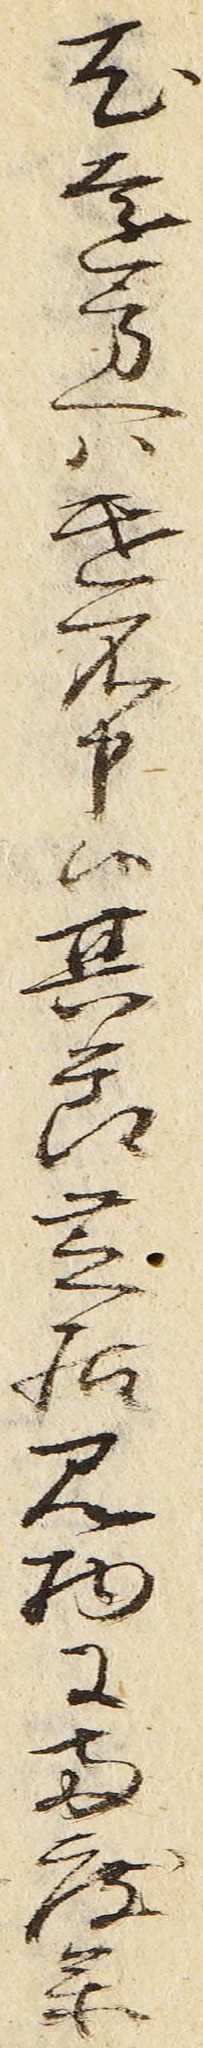尤遠方へは遣不申候其節芝居見物に両度参
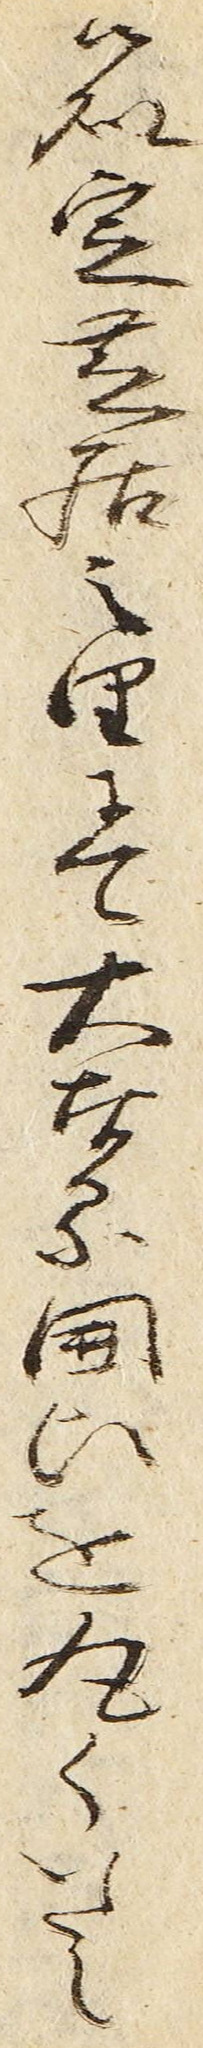候処定芝居之由にて大なる囲ひを丸くいたし
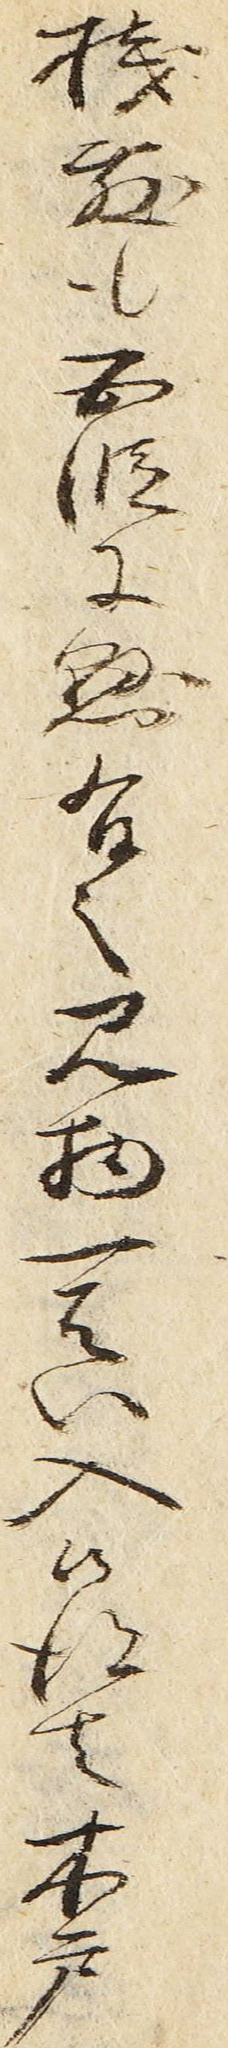桟敷も五段に懸有之見物一はい入候得は木戸
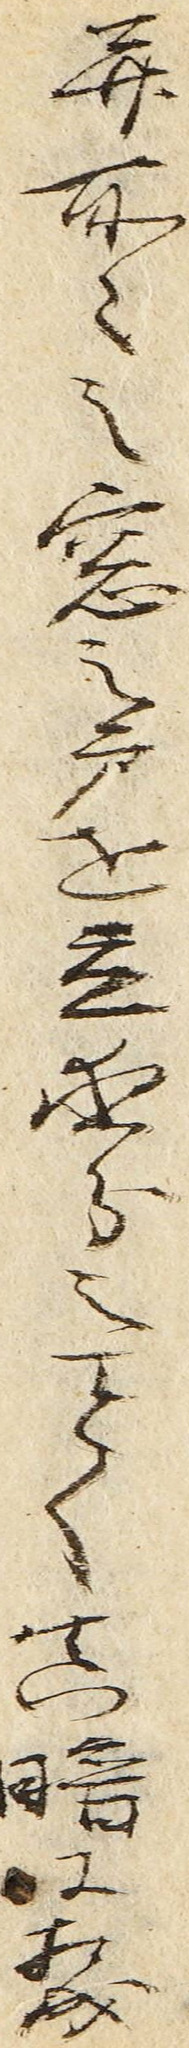并所々之窓之戸を昼夜分之ことく真暗に相成
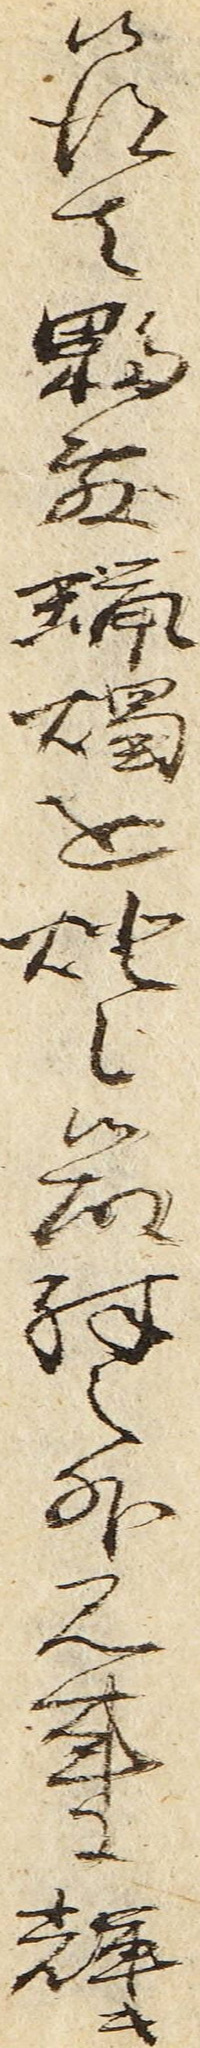候得は夥敷蝋燭を灯し候故殊之外見事に輝キ
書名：漂民後記
